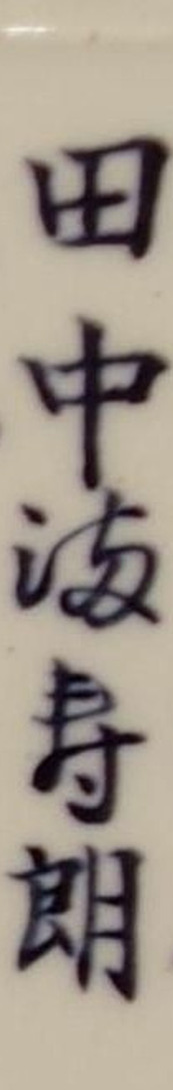田中満寿朗
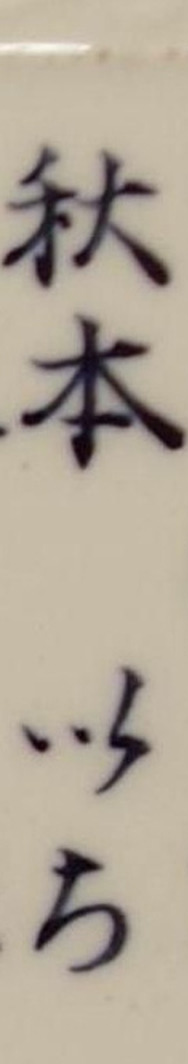秋本いち
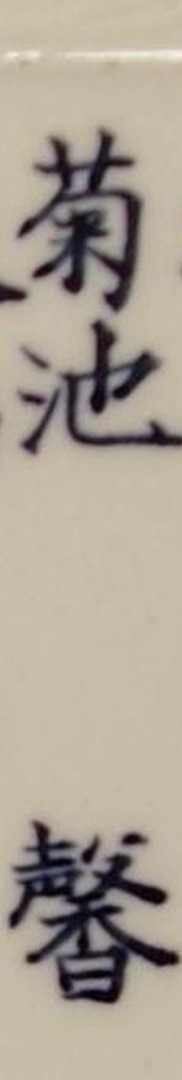菊池馨
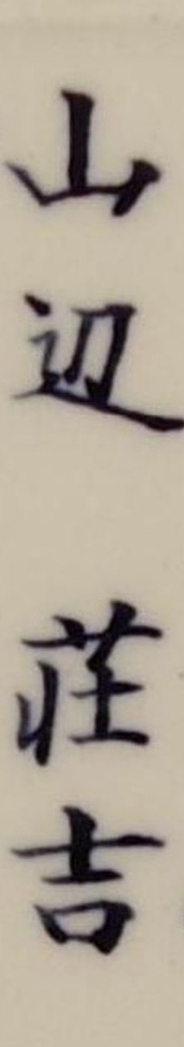山辺荘吉
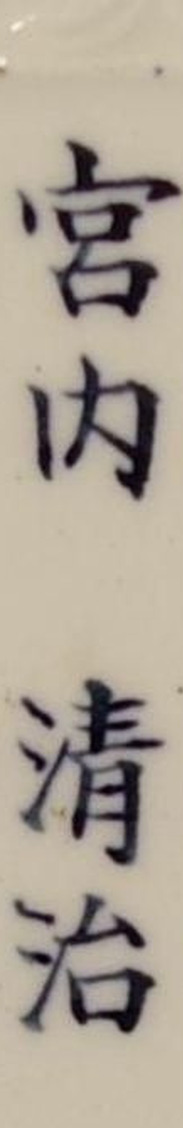宮内清治
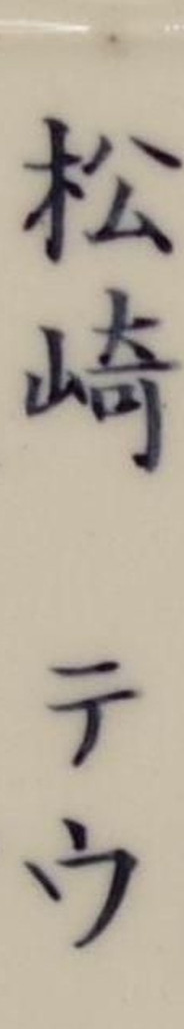松崎テウ
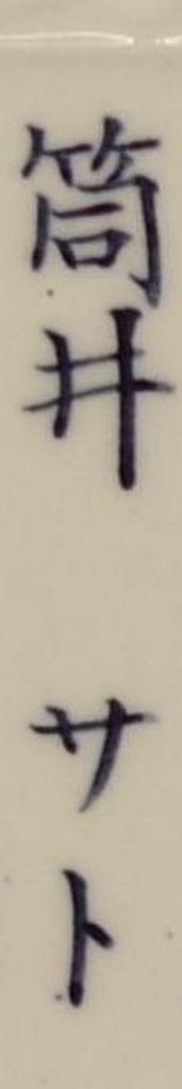筒井サト
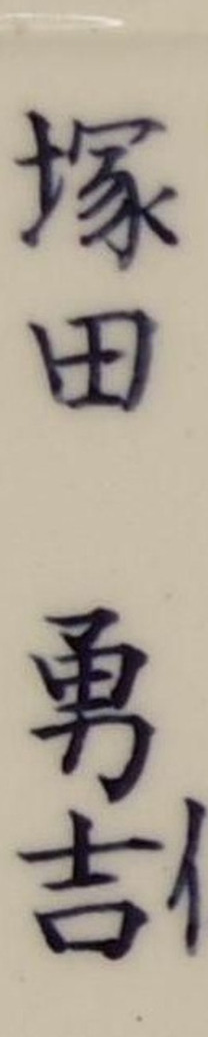塚田勇吉
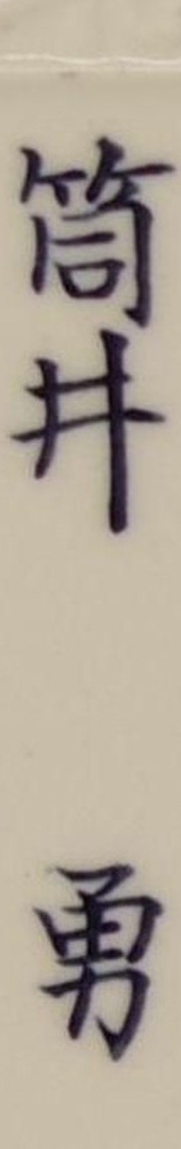筒井勇
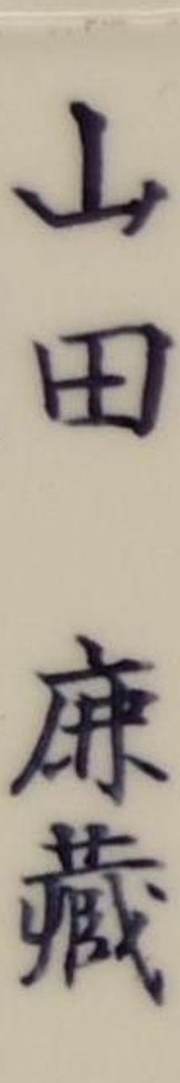山田廉蔵
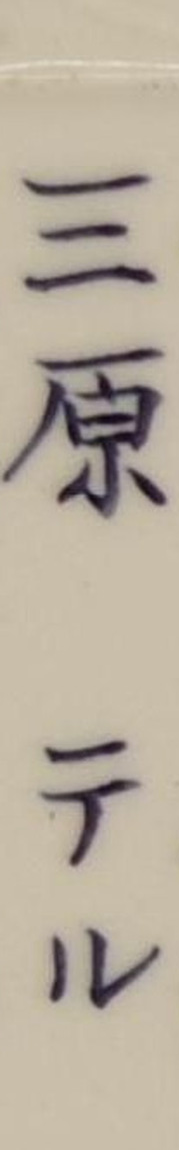三原テル
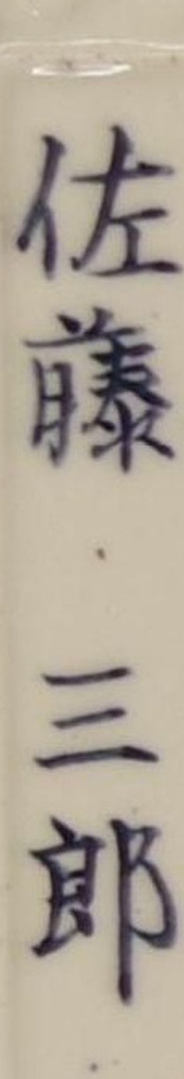佐藤三郎

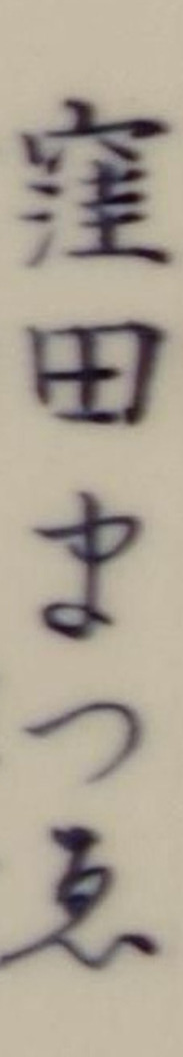窪田まつえ
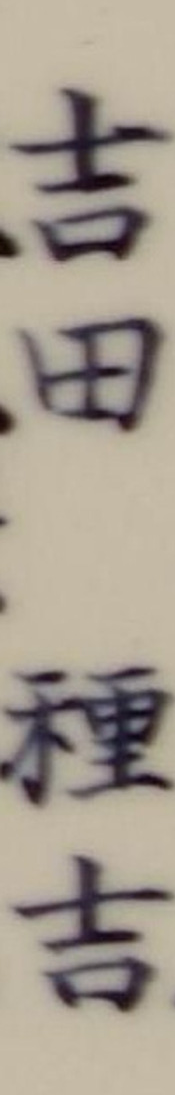吉田種吉
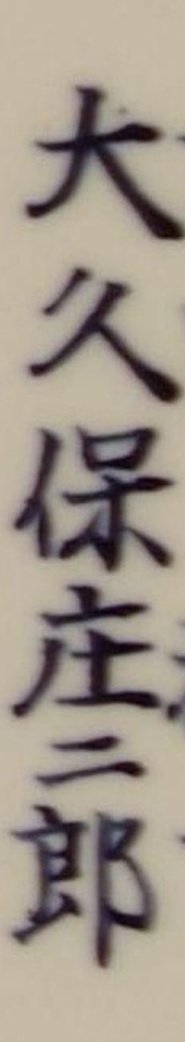大久保庄二郎
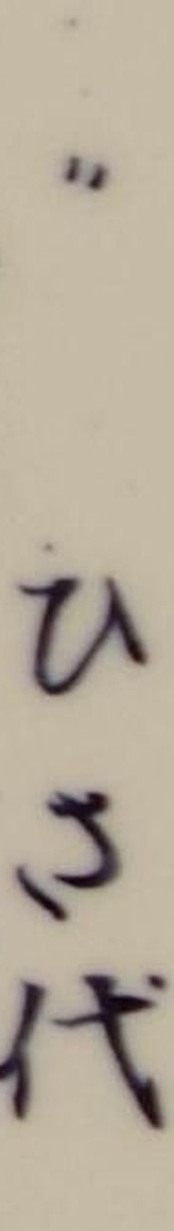ひさ代
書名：M~S
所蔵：高野山金剛峯寺
